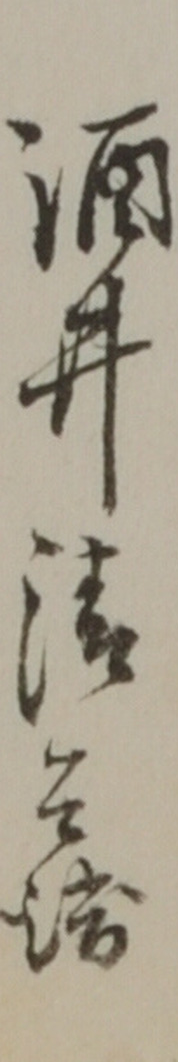酒井清兵衛
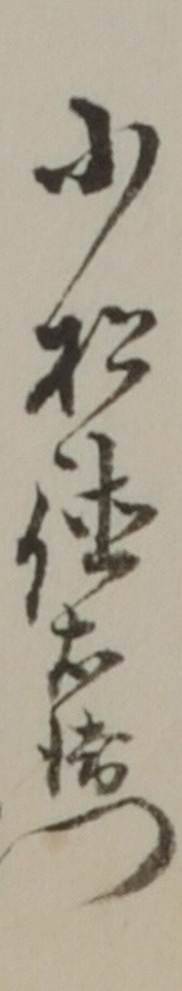小松徳右衛門
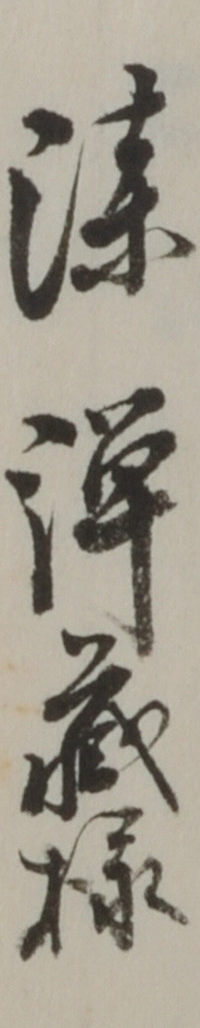漆禅蔵様
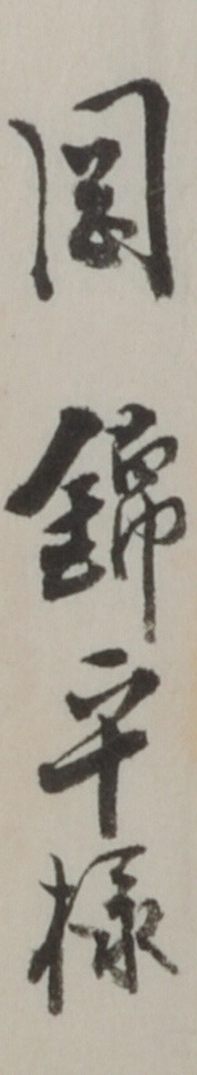岡錦平様
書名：書状
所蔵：伊那市立高遠町図書館・合同会社AMANE
